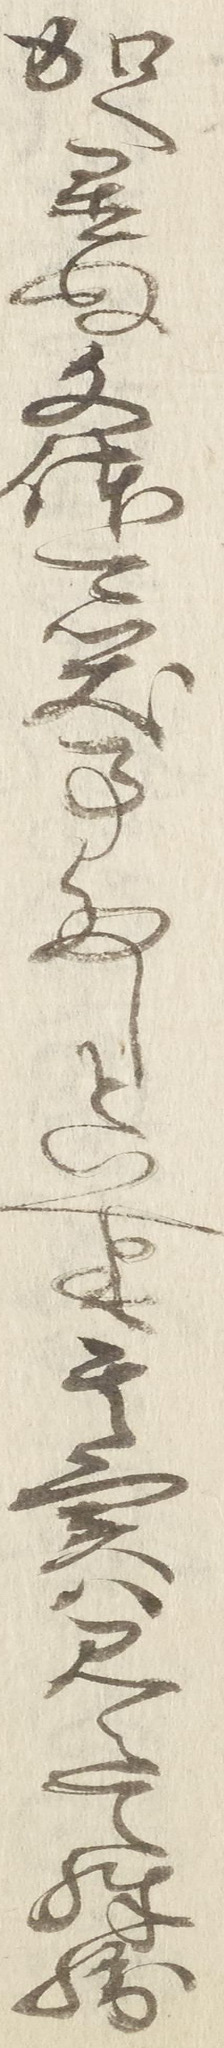加へ置ぬ文体可笑事多しといへとも其実は見たて殊勝
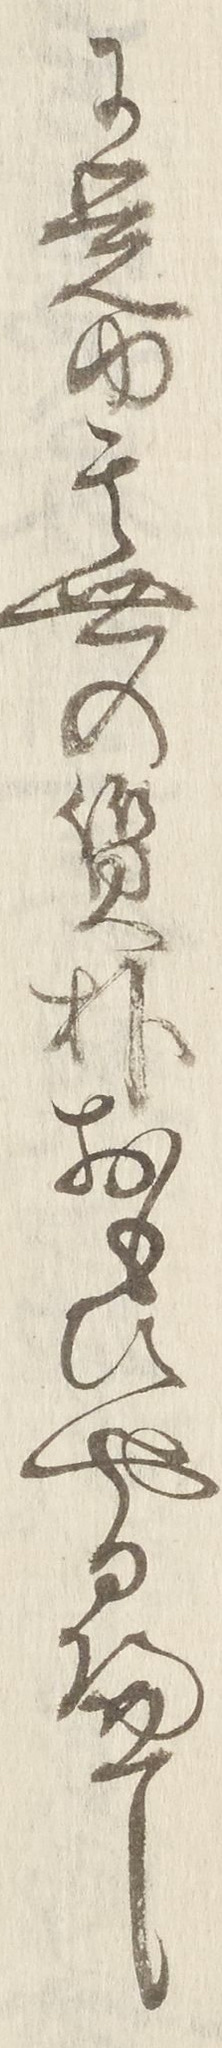に覚ゆ其世の質朴おもひやるへし
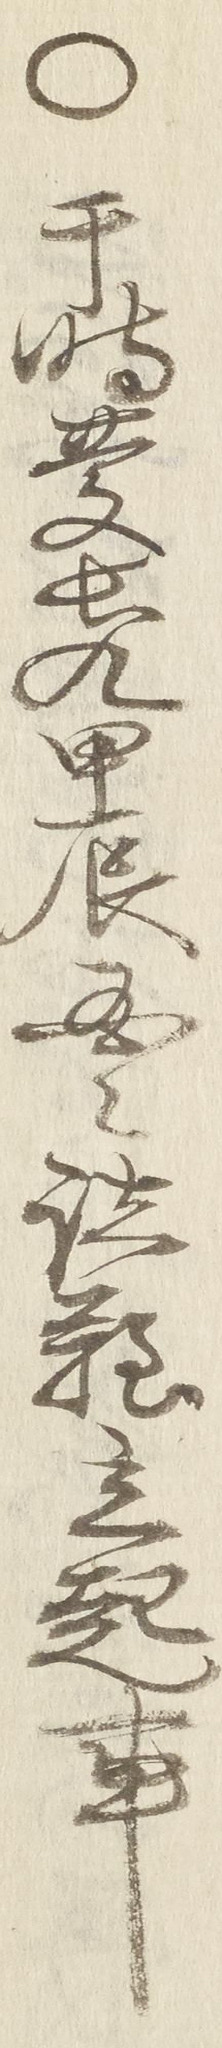〇干時慶長九甲辰国々諸難立起事
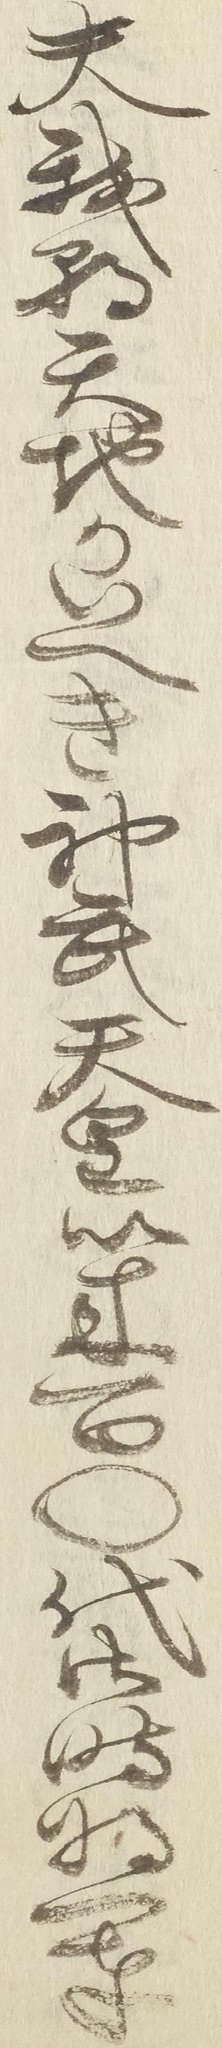夫我朝天地かいへき神武天皇以来百〇代御時将軍

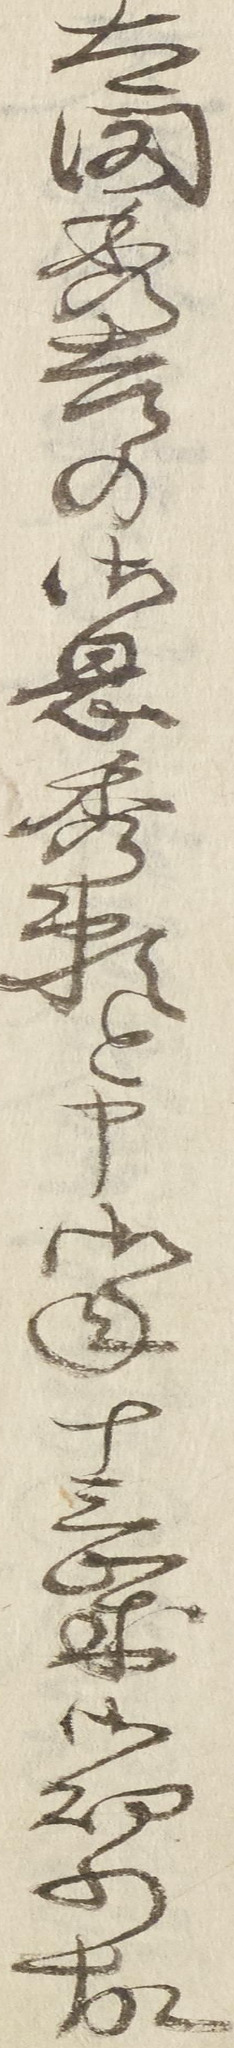太閤秀吉の御息秀頼と申御年十三歳御幼少故
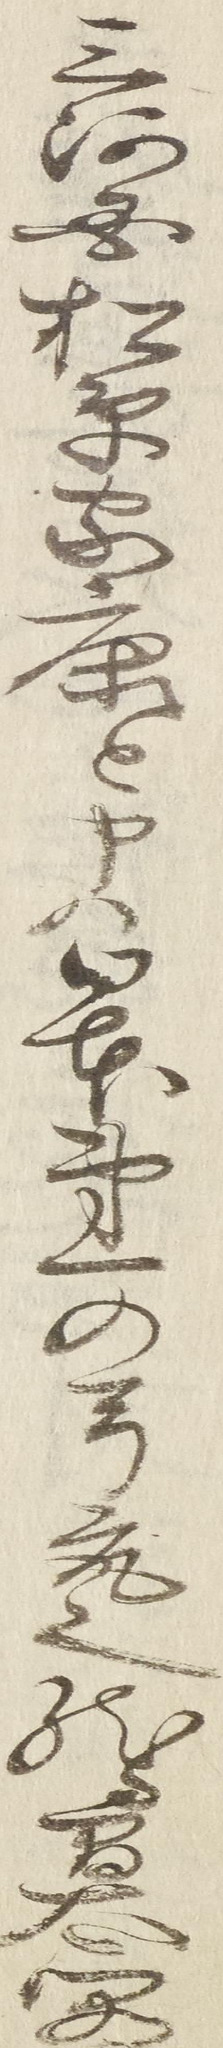三河国松平家康と申は日本第一の弓取也然る間太閤
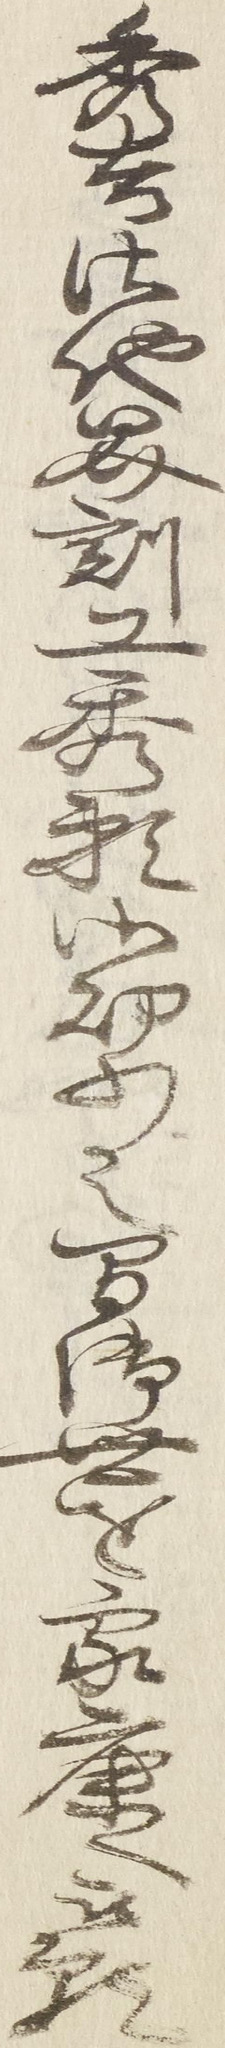秀吉は他界剰え秀頼御幼少之間御世を家康へ被願
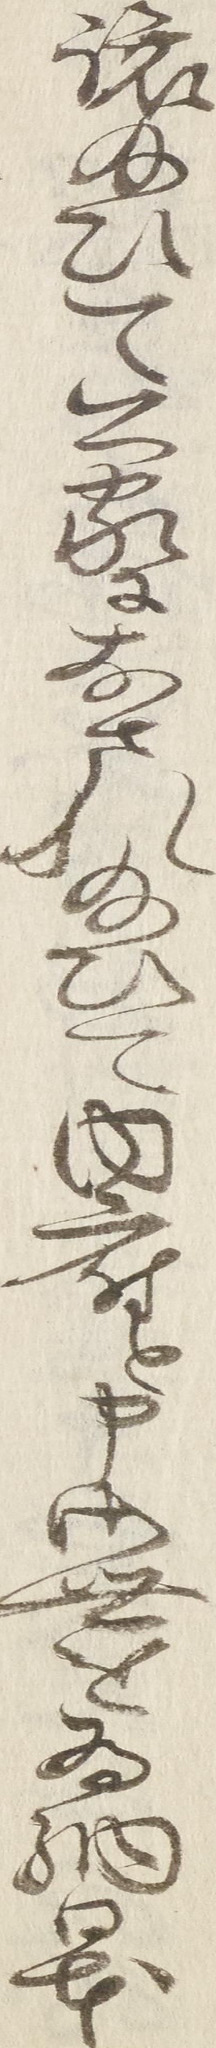諾給ひて公家になされ給ひて内府と申御世を為納日本
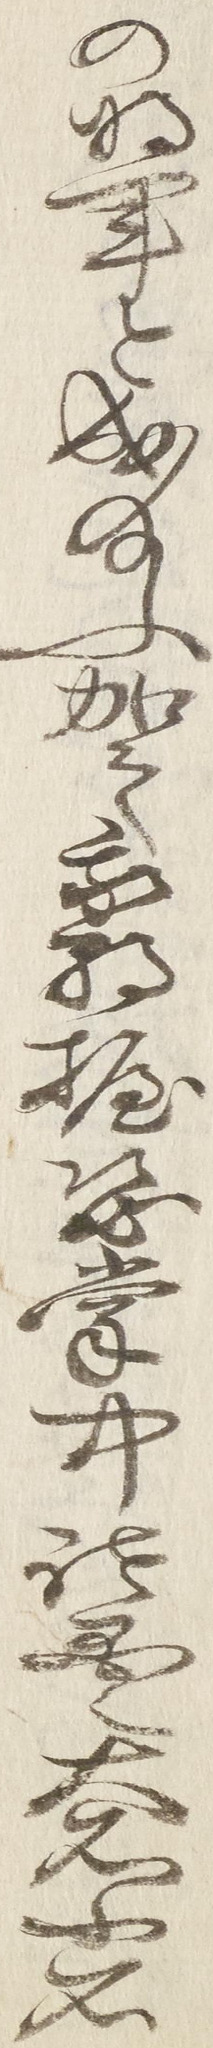の将軍と成給ふ加て我朝握恐掌中諸国大名小名
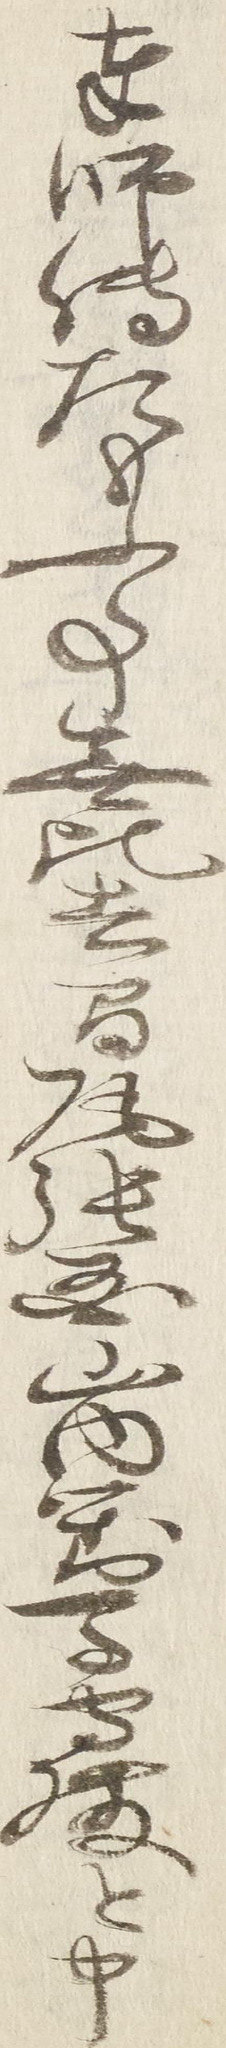奉師伝たもふ事無比去間尾張国山内対馬守殿と申
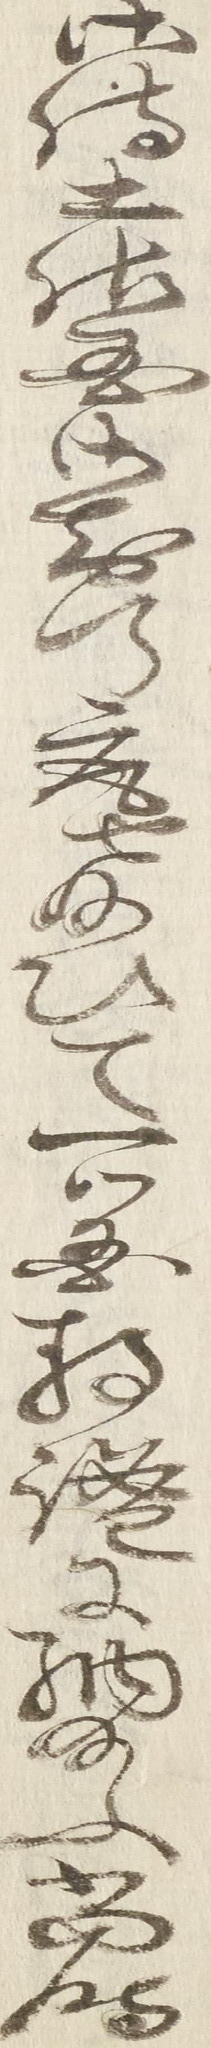御侍土佐国御知行取せ給ひて一ッ国静謐に納給ふ当時
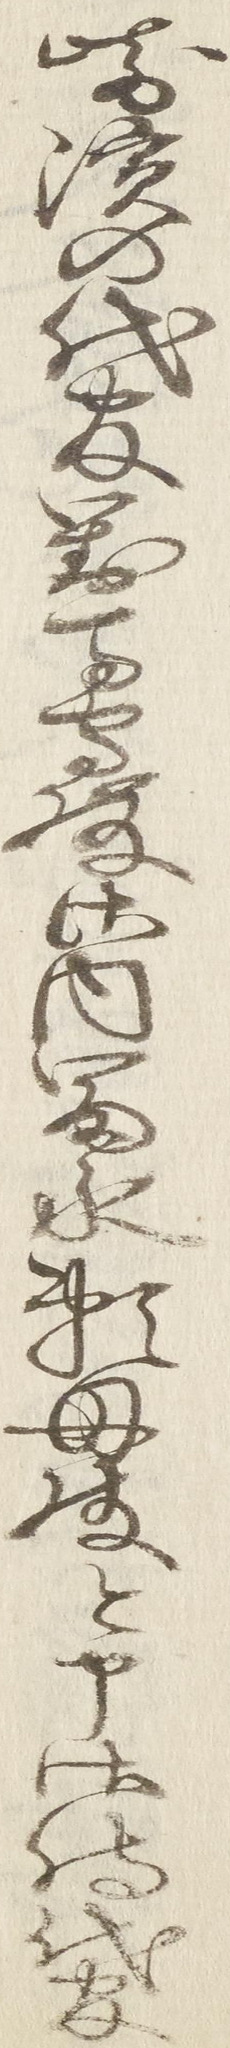崎浜の代官対馬守殿御内冨永頼母殿と申御侍代官
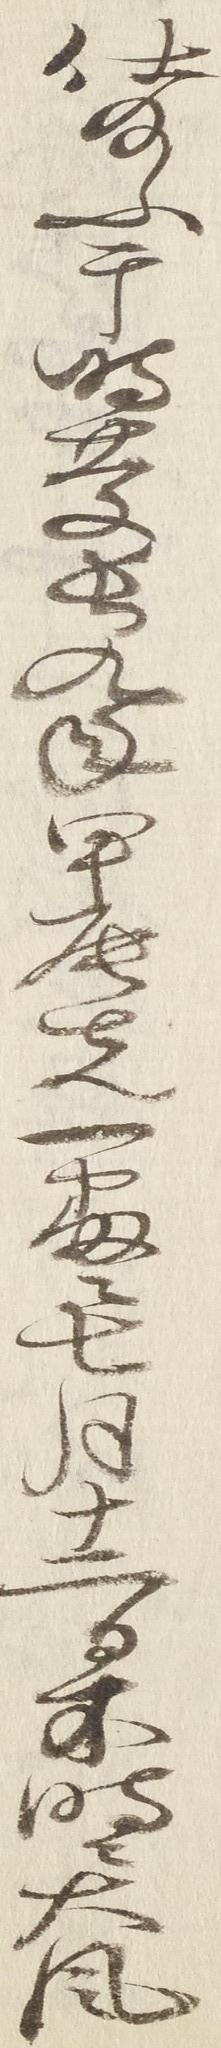仕給ふ干時慶長九年甲辰先一番に二七月十二日不時二大風
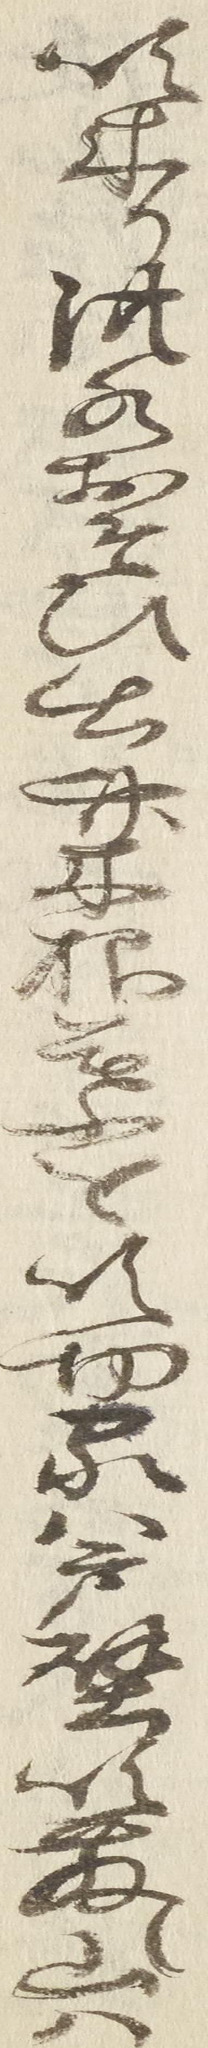吹来り洪水おそひ出竹木根葉を吹切家は戸壁吹崩し山は
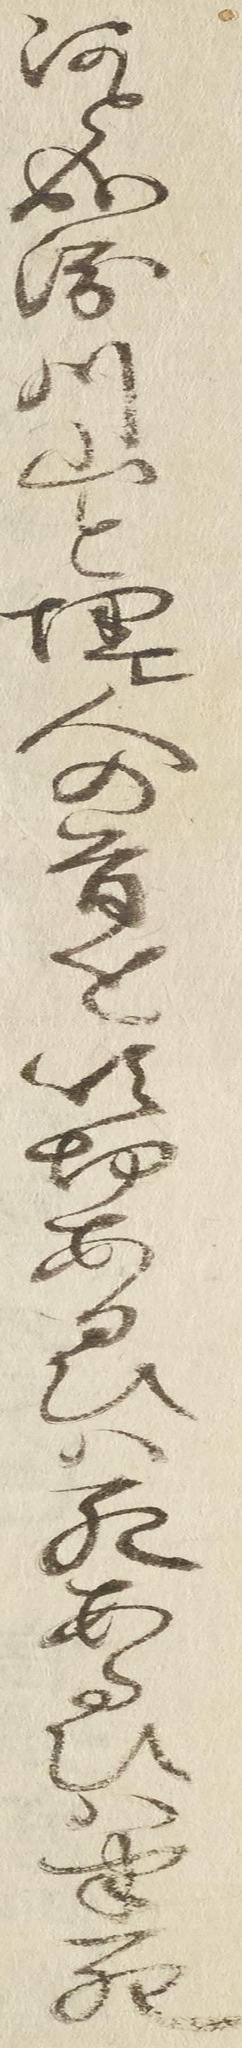河と成浦川山と埋ㇾ人の首を吹切あるひは死あるひは半死
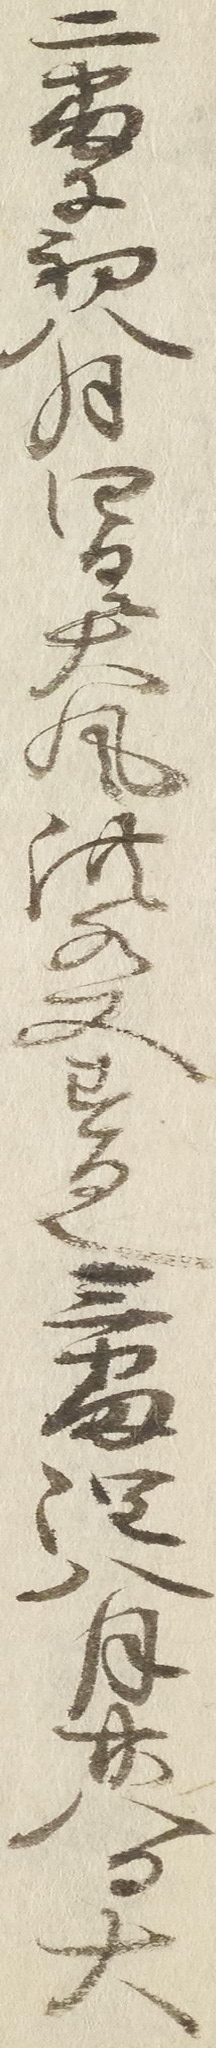二番に初八月四日に大風洪水又する也三番閏八月廿八日大
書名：地震記　下
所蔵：東京大学地震研究所図書室 Earthquake Research Institute Library, The University of Tokyo, JAPAN
